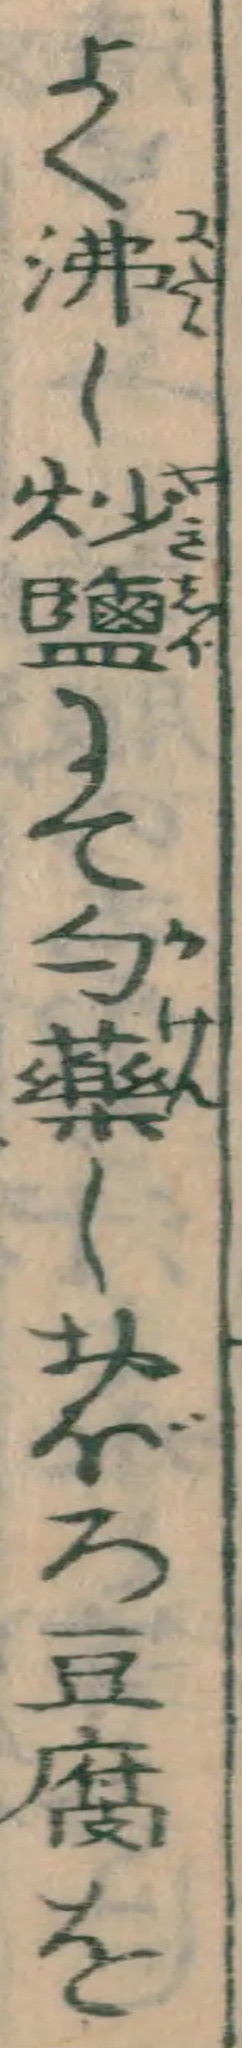よく沸し炒塩にて勺薬しおぼろ豆腐を
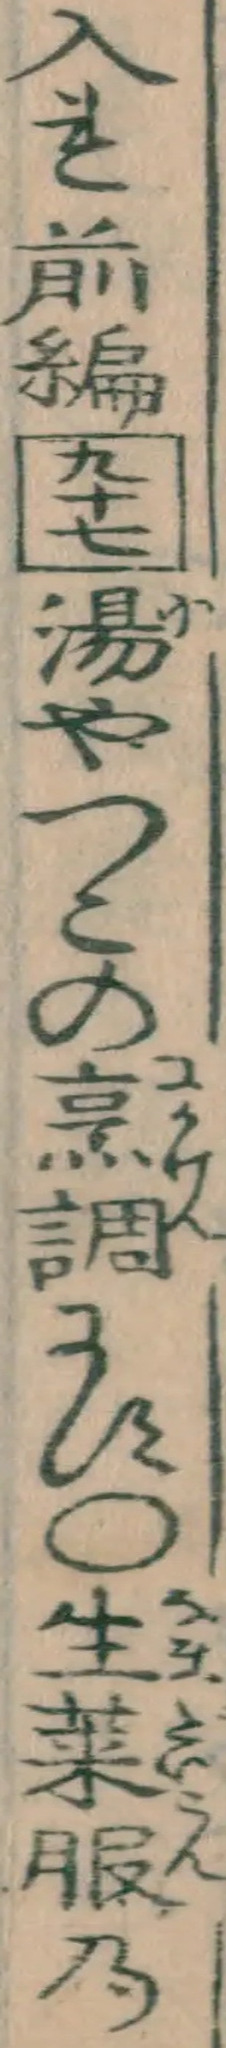入れ前編九十七湯やつこの烹調にす○生菜服の
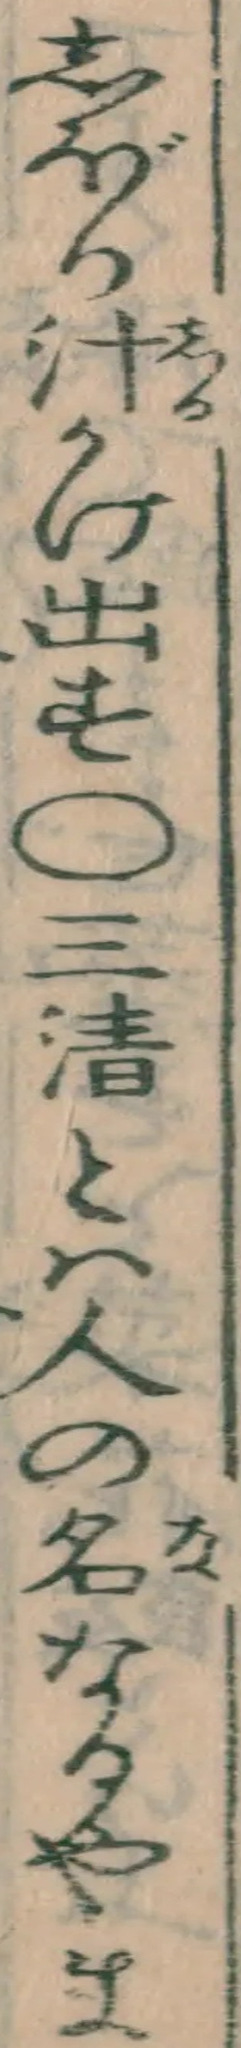しぼり汁かけ出す○三清とは人の名なるやま
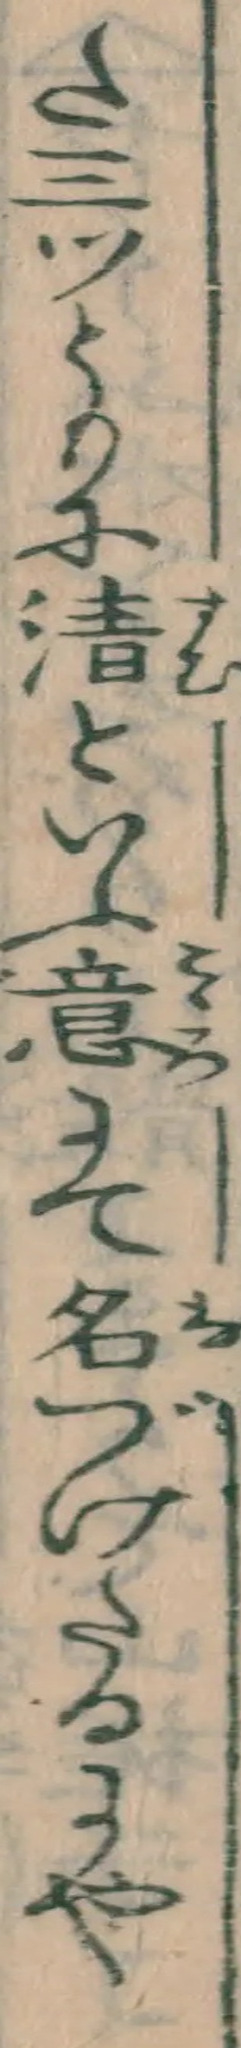た三つともに清といふ意にて名づけたるにや
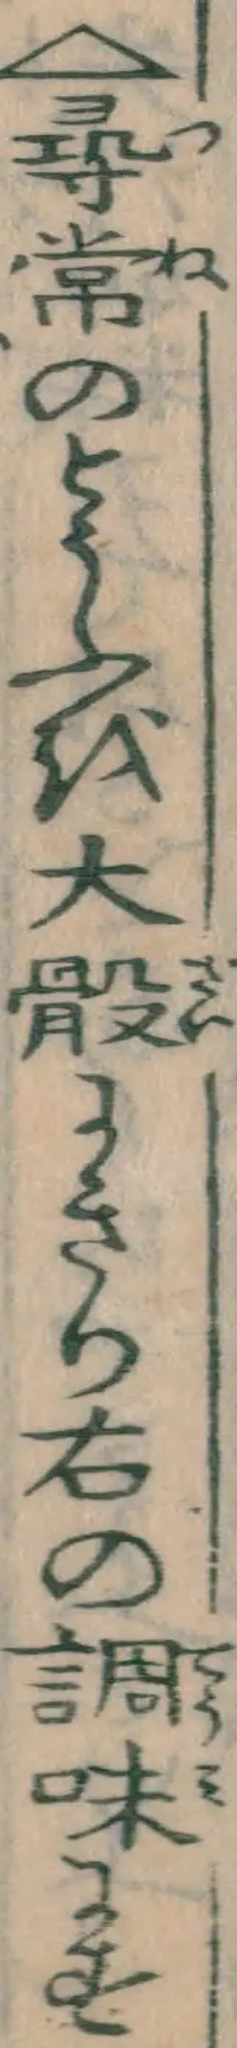△尋常のとうふを大骰にきり右の調味にす
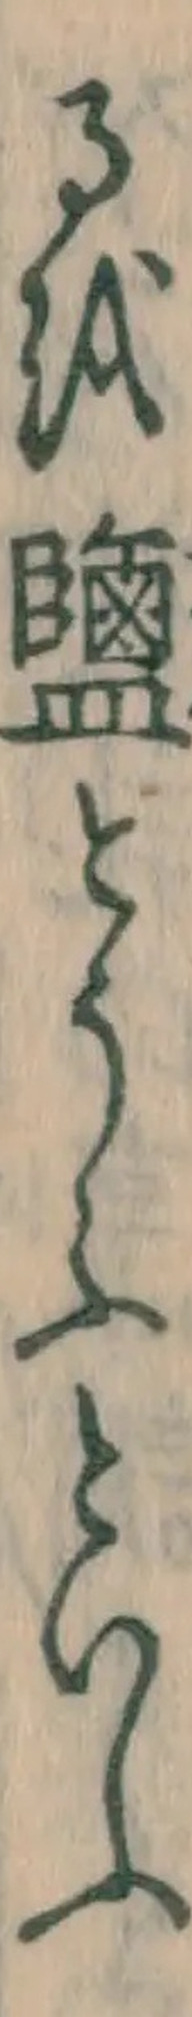るを塩とうふといふ
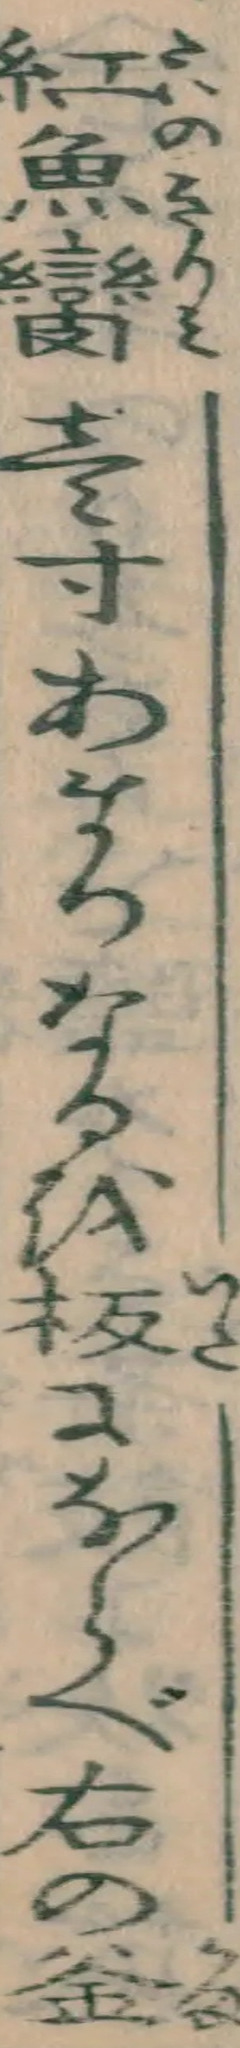紅魚臠壱寸あまりなるを板にならべ右の釜
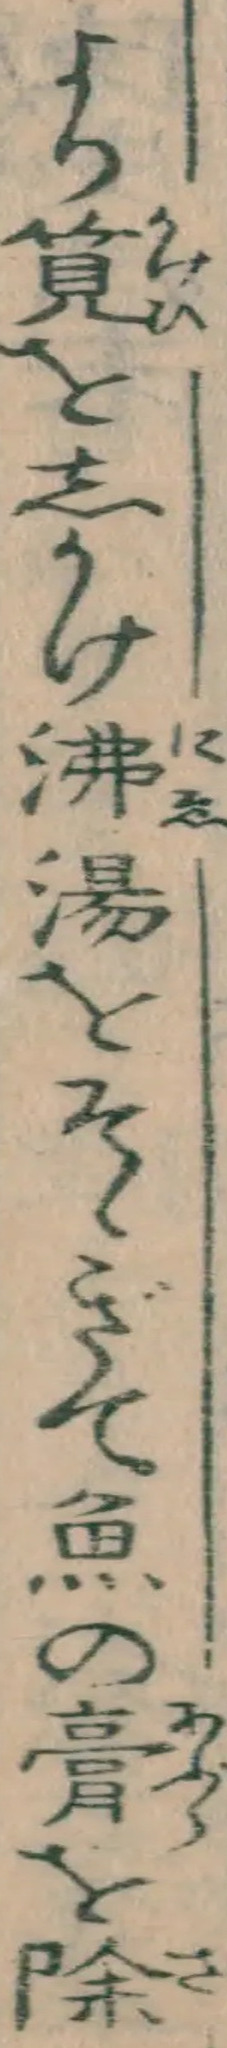より筧をしかけ沸湯をそゝぎて魚の膏を除
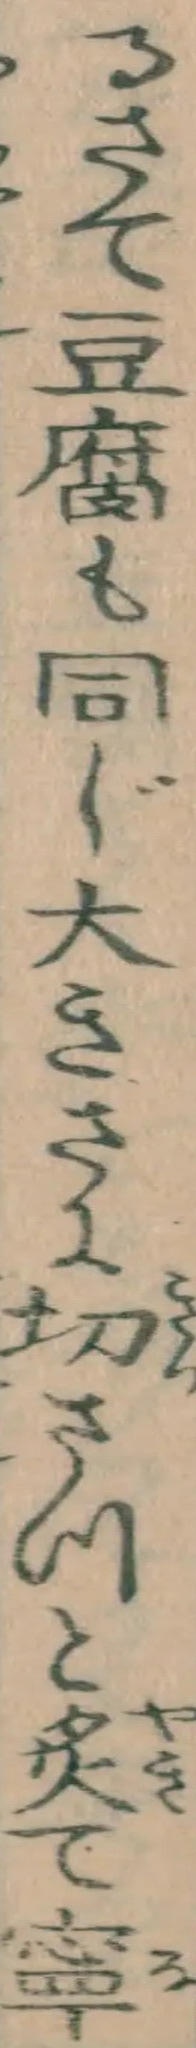るさて豆腐も同じ大きさに切さつと炙て寧
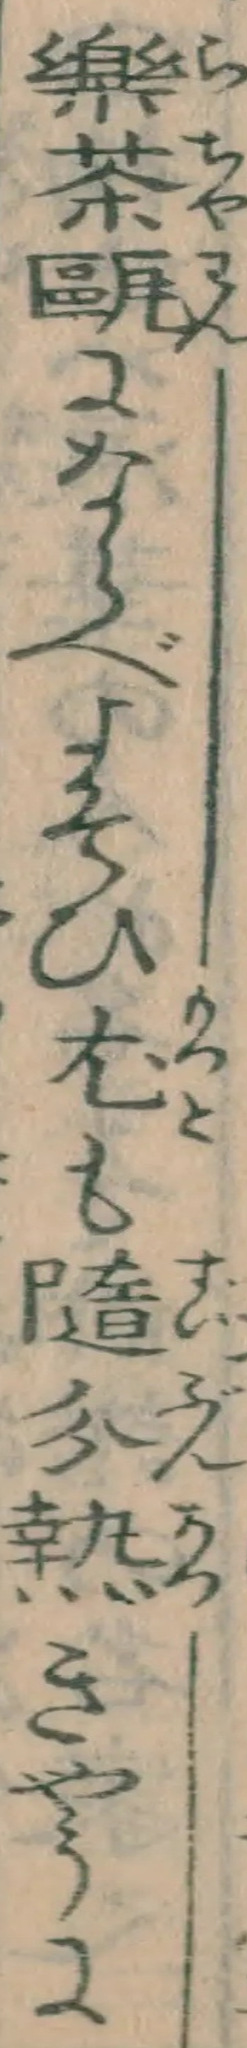楽茶甌にならべよそひ尤も随分熱きやうに
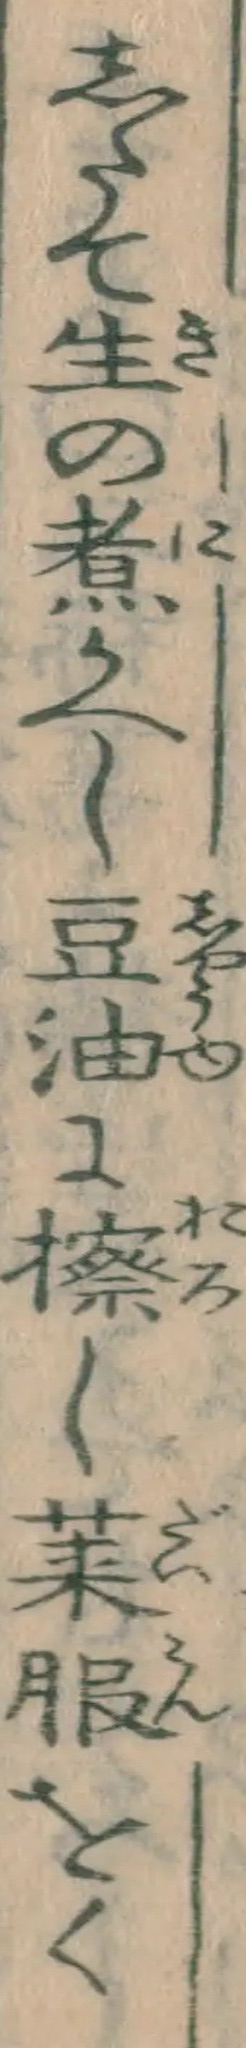したて生の煮かへし豆油に擦し菜服をく
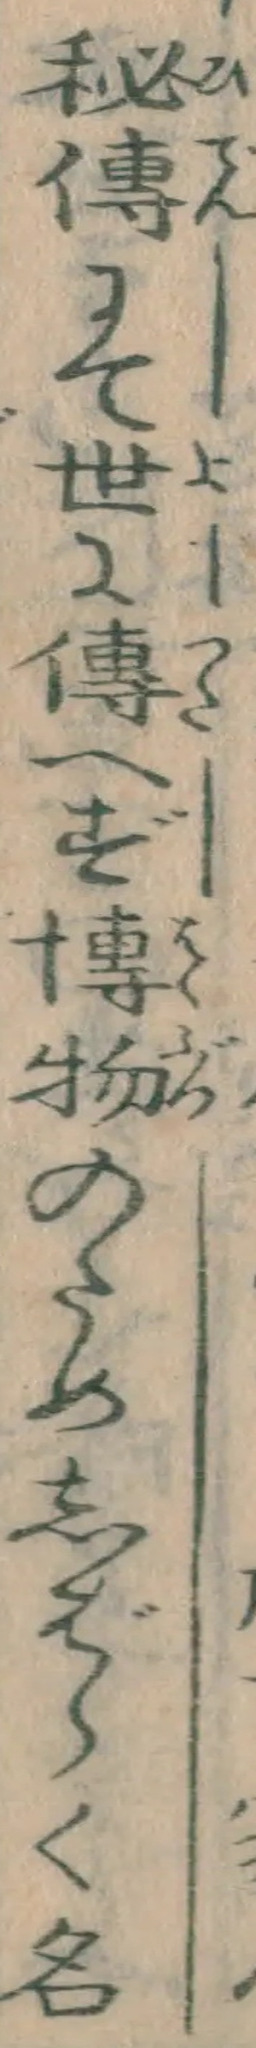秘伝にて世に伝へず博物のためしばらく名
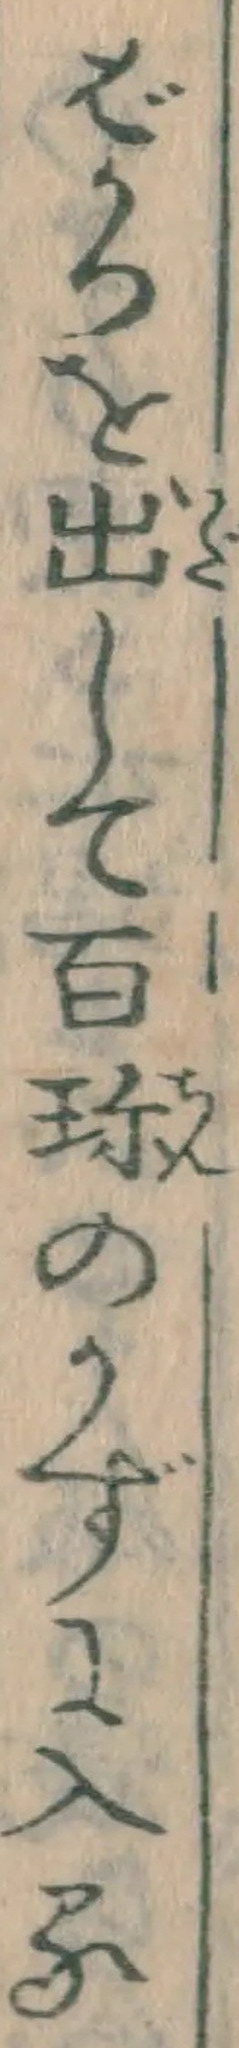ばかりを出して百珍のかずに入る
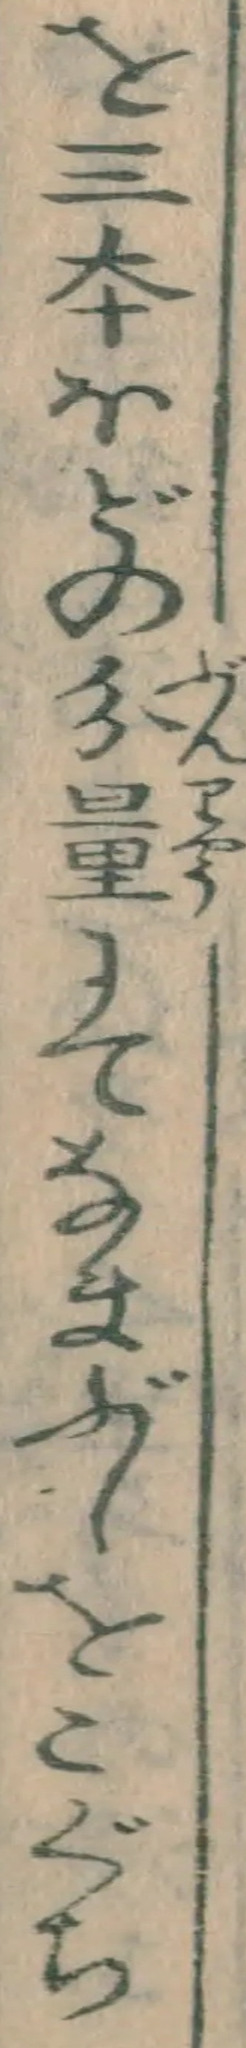を三本ほどの分量にてなまぶしをこぐち

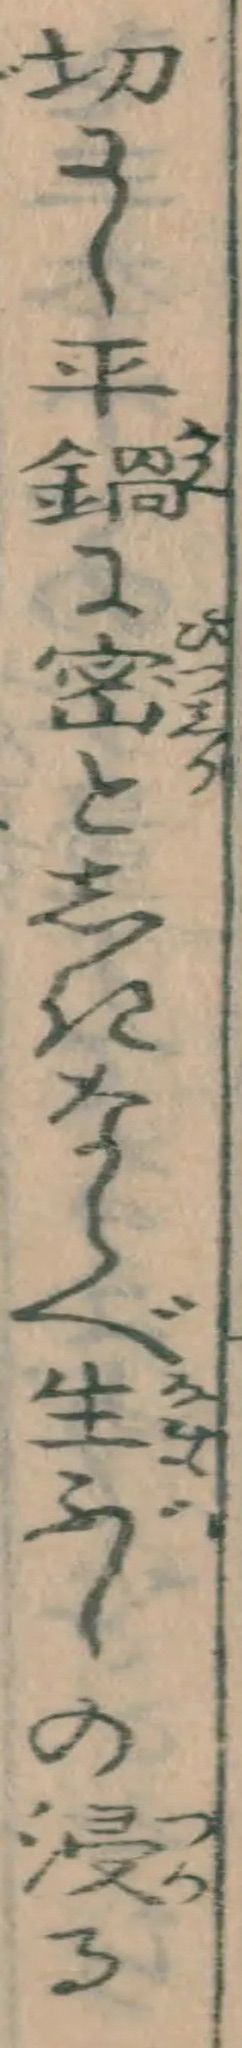切にし平鍋に密としきならべ生ぶしの浸る
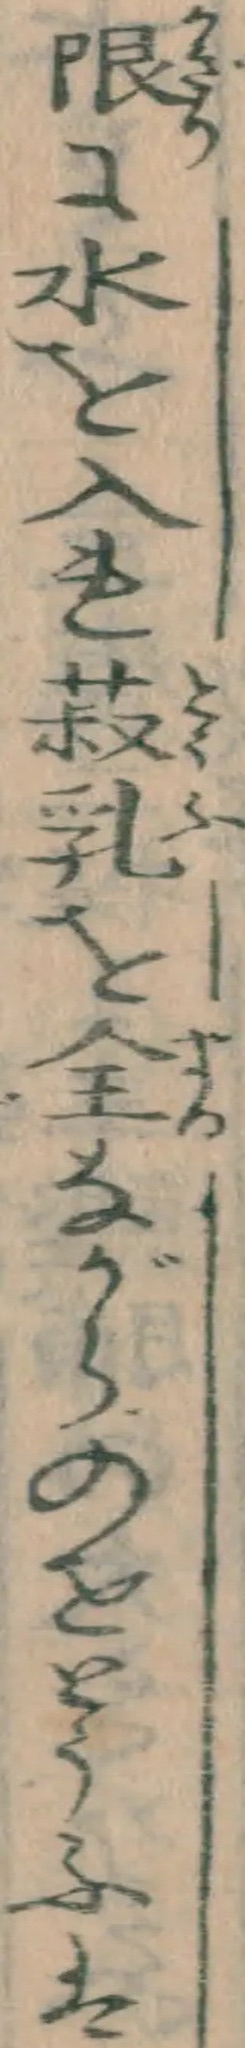限に水を入れ菽乳を全ながらのせとうふは
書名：豆腐百珍. 続編
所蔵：国立国会図書館 National Diet Library, JAPAN
